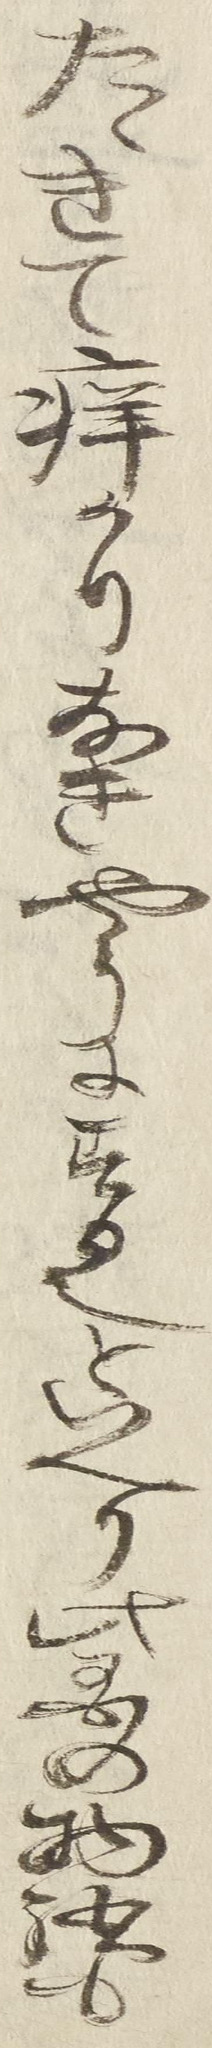たゝきて痒かりなきやうにする也といへり此国の物語も
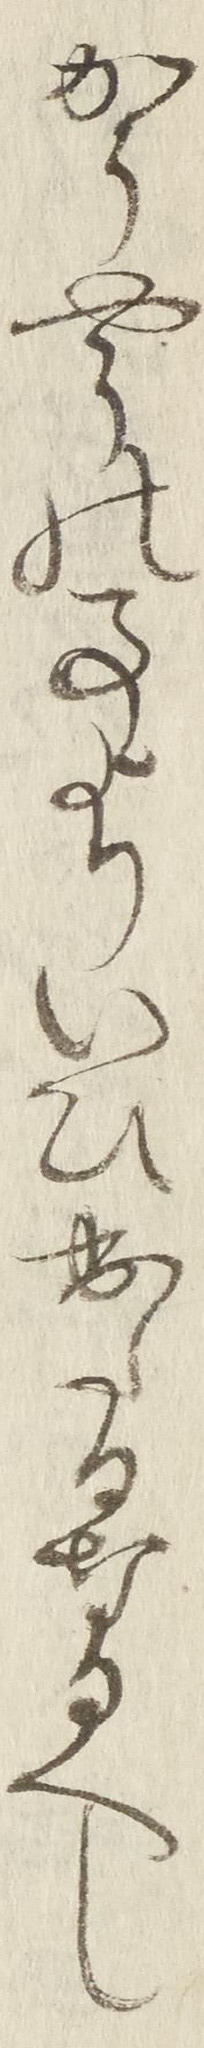かうやうの事よりいひあたるなるへし
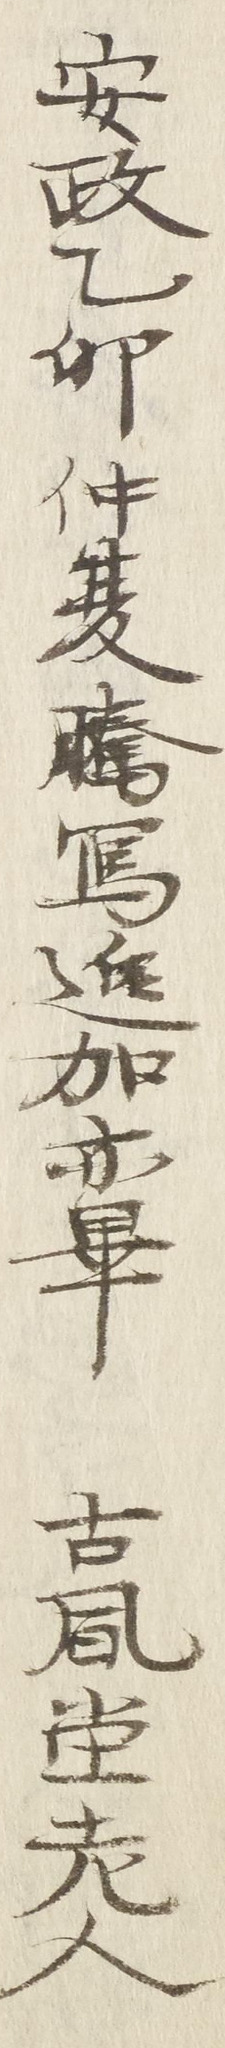安政乙卯仲夏謄写追加亦畢古風堂老人
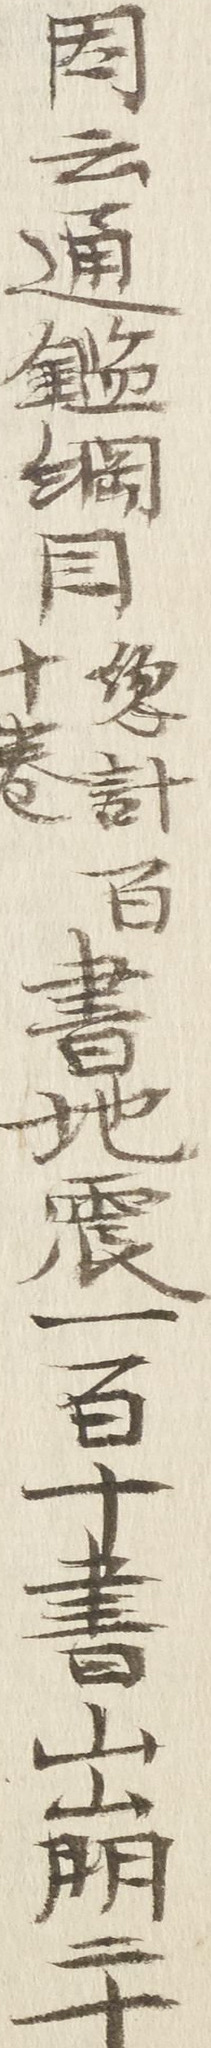因云通鑑網目総計百十巻書地震一百十書山崩二十
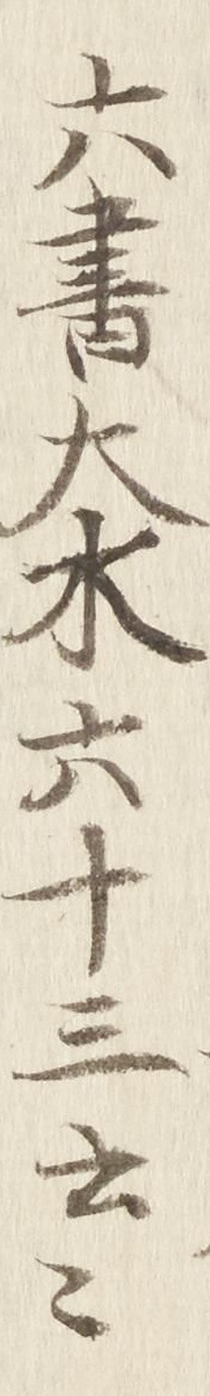六書大水六十三云々
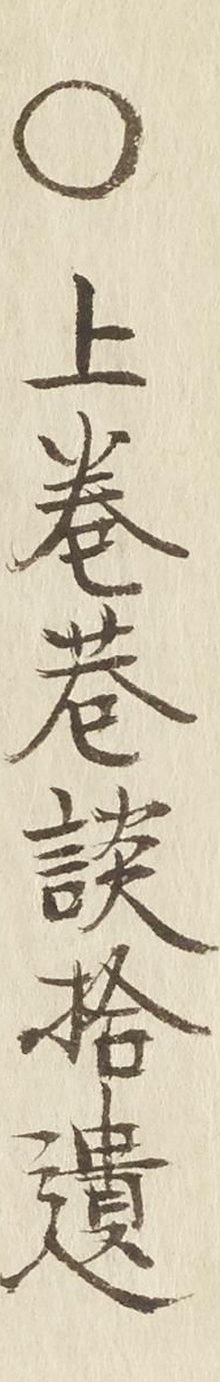〇上巻巷談拾遺
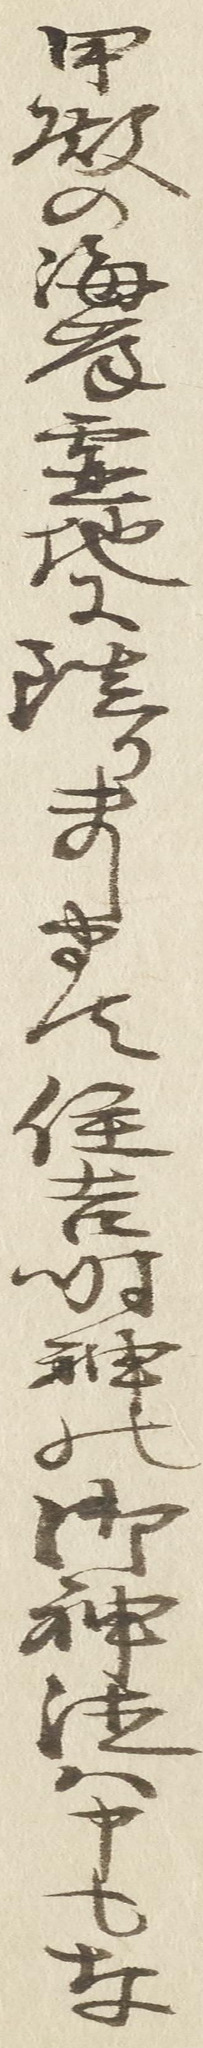甲殿の海岸に鎮りまします住吉明神の御神徳は申もな
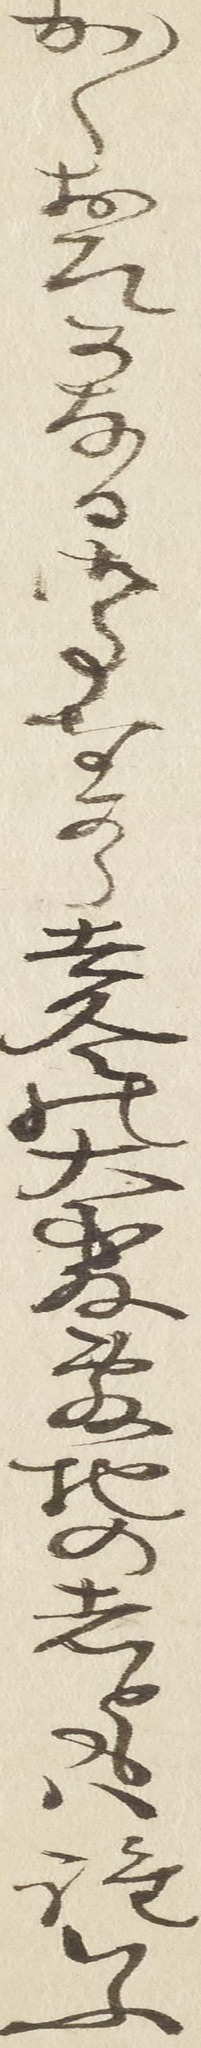か〳〵おそろなる事なから去冬の大変敷地の者ともは誰いふ
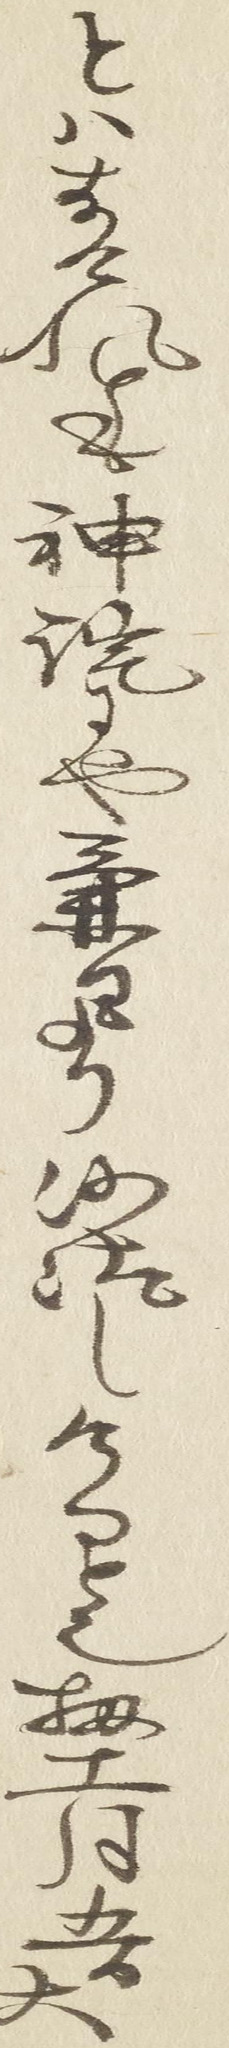とはなけれとも神院にや兼而より沙汰しけると也扨十一月五日大
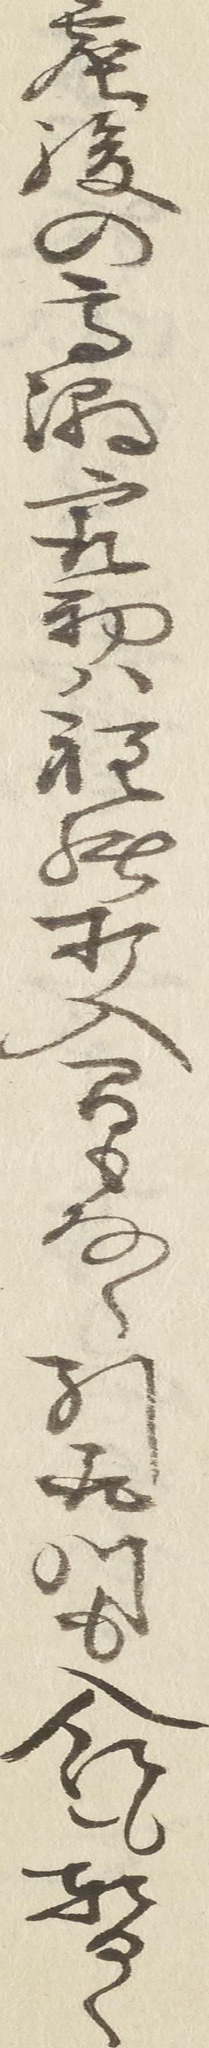震後の高潮最初は程無打入間もなく引取川も入江も暫く
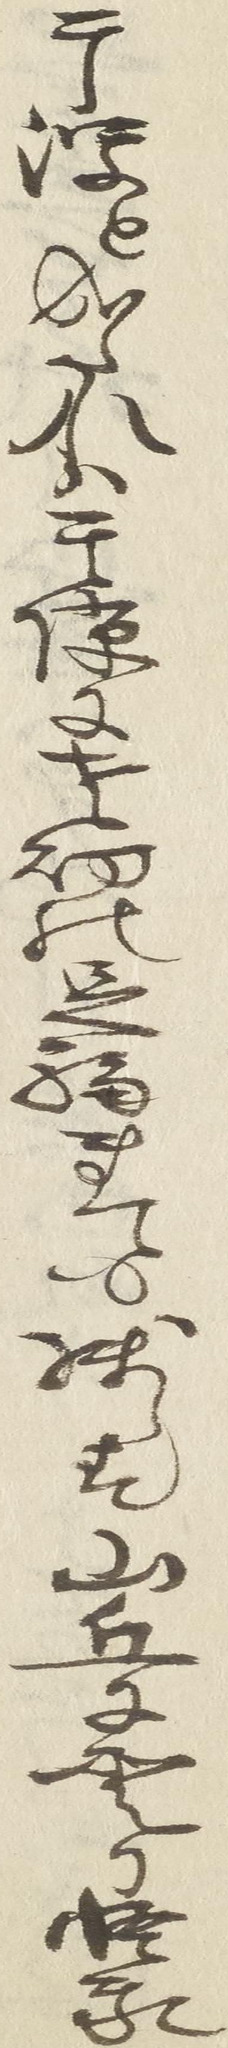干潟と成けれは其隙に最初の足胸まても残らす山丘に登り怪我
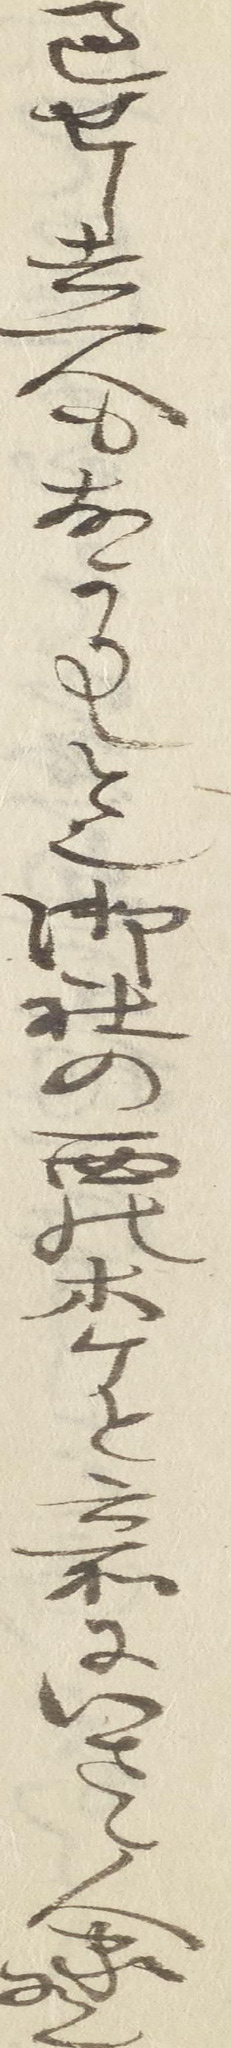過せし者一人もなかりしと也御社の西のホケと云所にいたく人家有
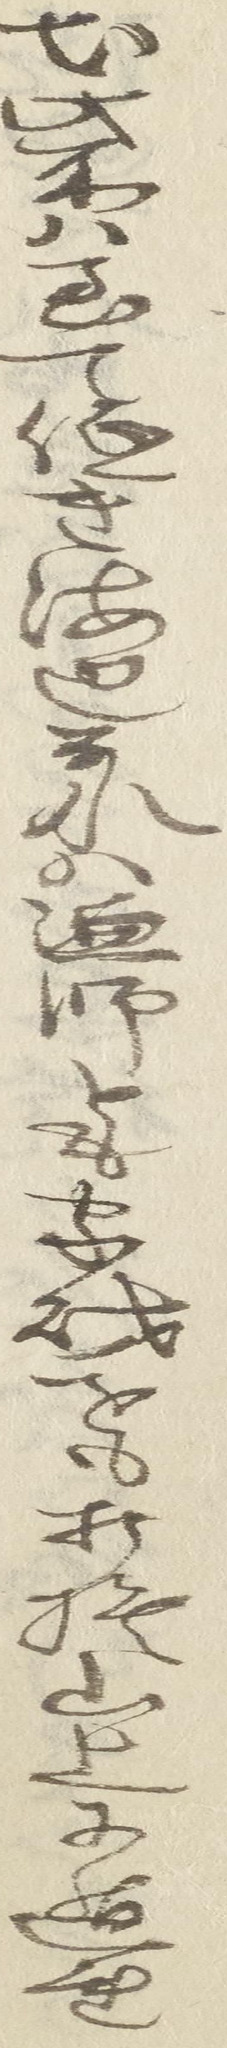尤此所は至て低き海辺なれは漁師とも家財をも打捨山上に遁れ
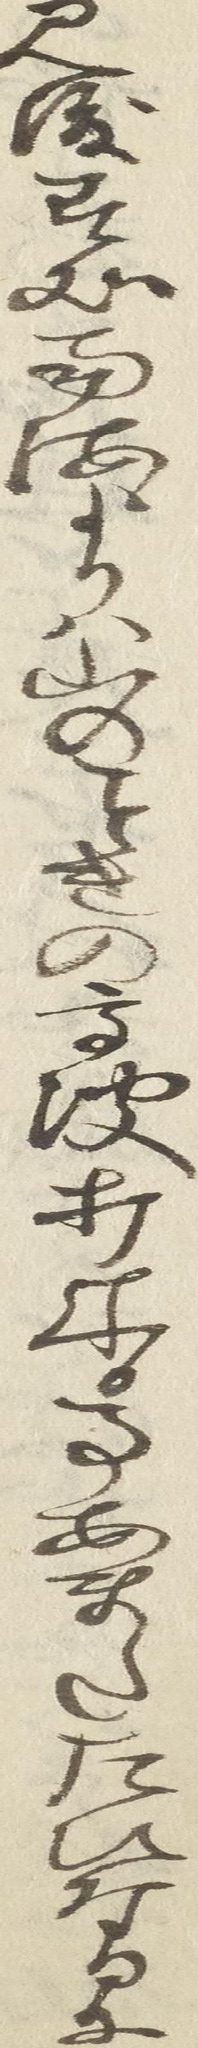見渡す処南海よりは山のこときの高波打来る事あまたたひなるに
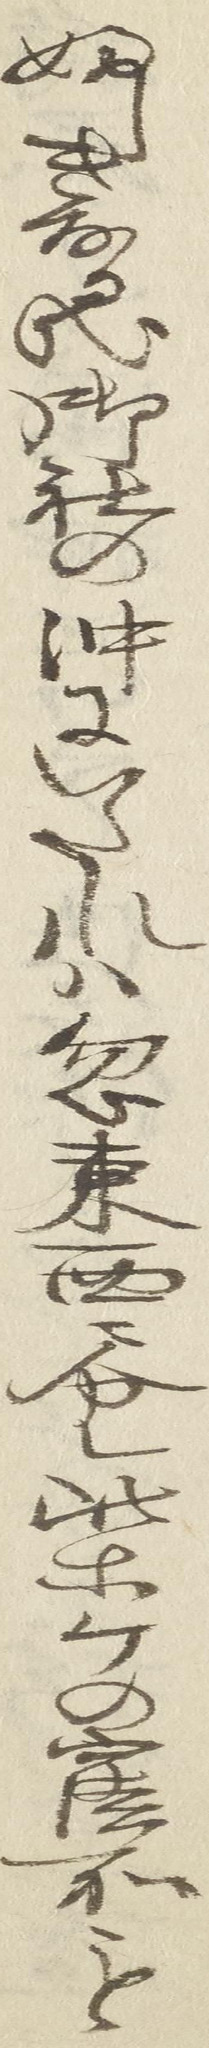ふしきなる哉御社の仲にいたれは忽東西に分れ此ホケの窪所も
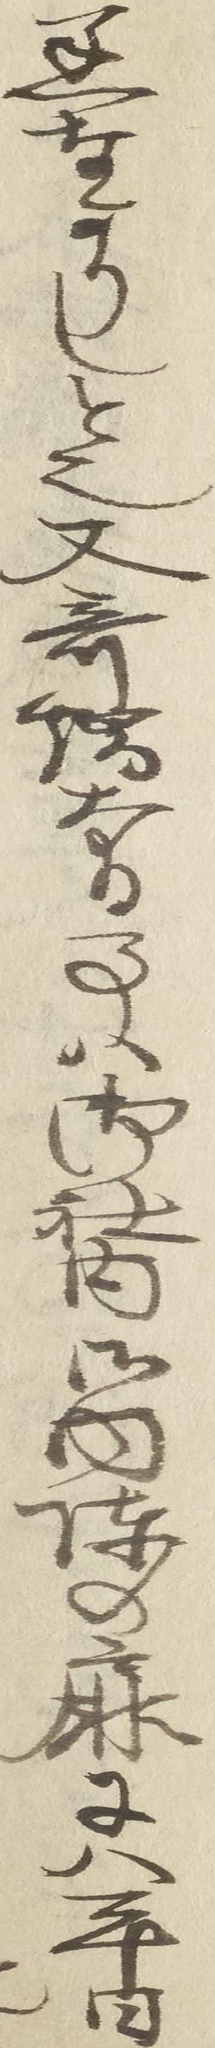恙なかりしと也又奇端なる事は御社内陣の扉には平日
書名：地震記　下
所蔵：東京大学地震研究所図書室 Earthquake Research Institute Library, The University of Tokyo, JAPAN
